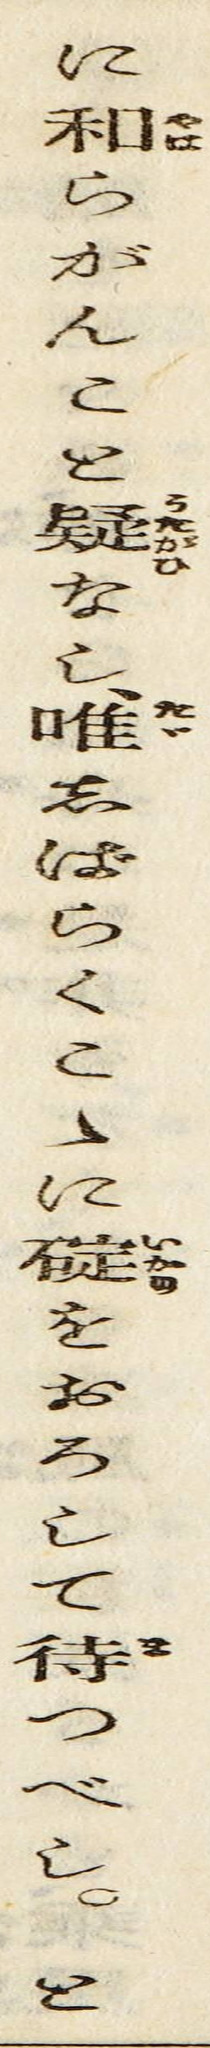に和らがんこと疑なし、唯しばらくこゝに碇をおろして待つべし。と
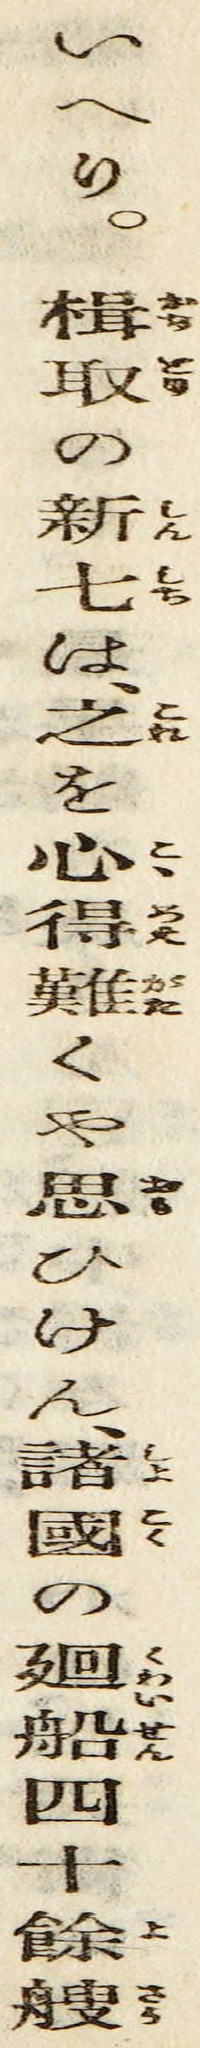いへり。楫取の新七は、之を心得難くや思ひけん、諸国の廻船四十余艘
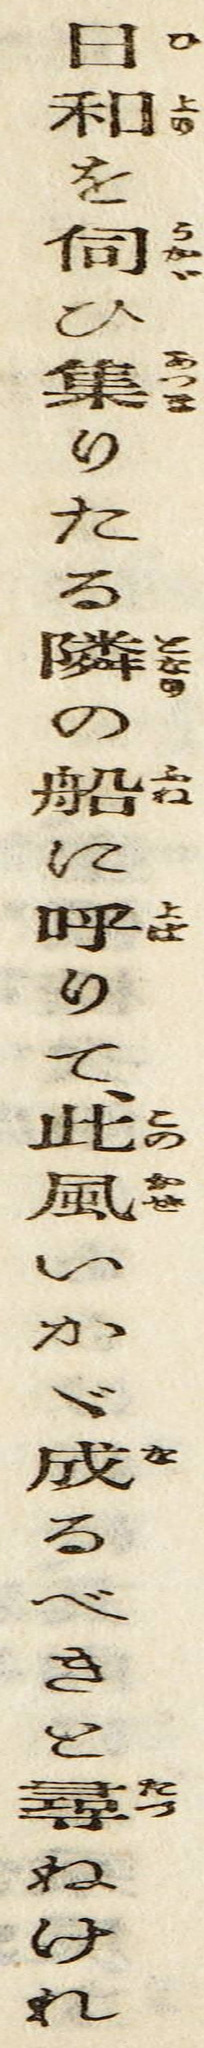日和を伺ひ集りたる隣の船に呼りて、此風いかヾ成るべきと尋ねけれ

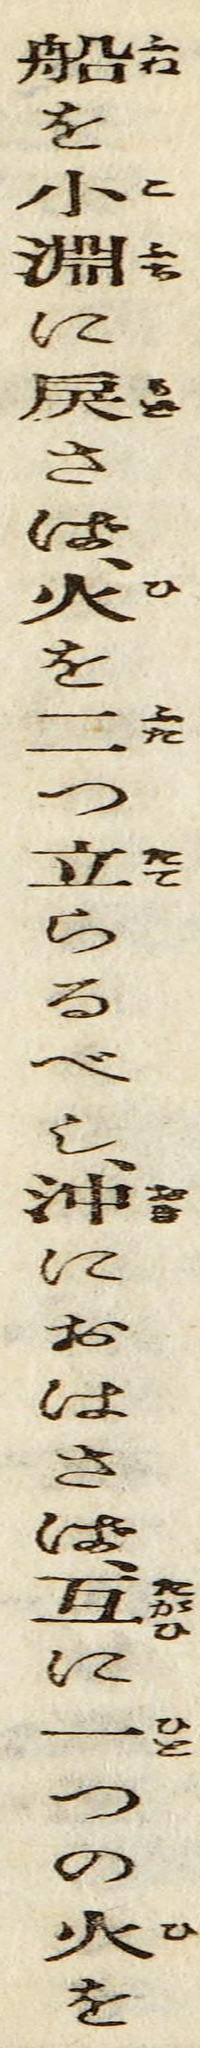船を小淵に戻さば、火を二つ立らるべし、沖におはさば、互に一つの火を
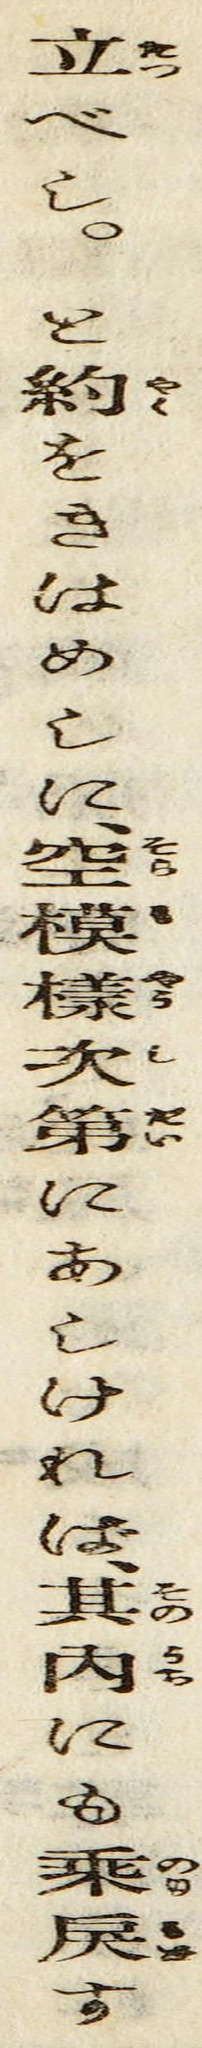立べし。と約をきはめしに、空模様次第にあしければ、其内にも乗戻す
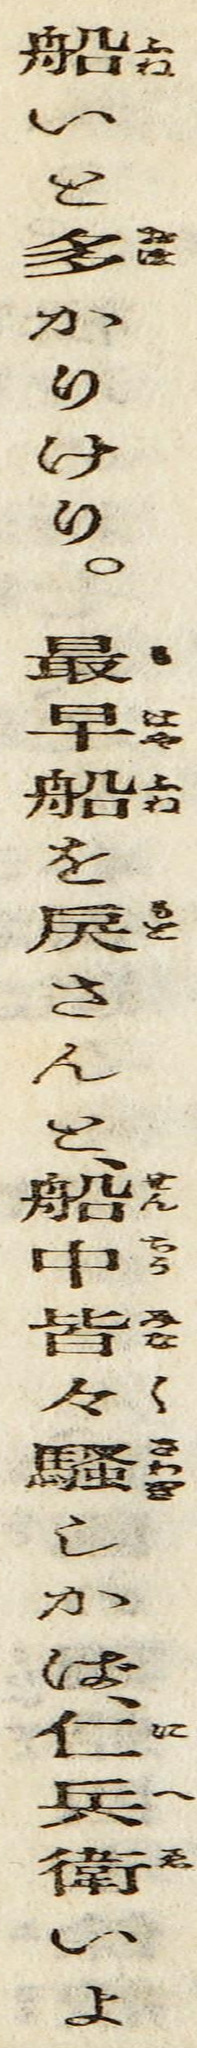船いと多かりけり。最早船を戻さんと、船中皆々騒しかば、仁兵衛いよ
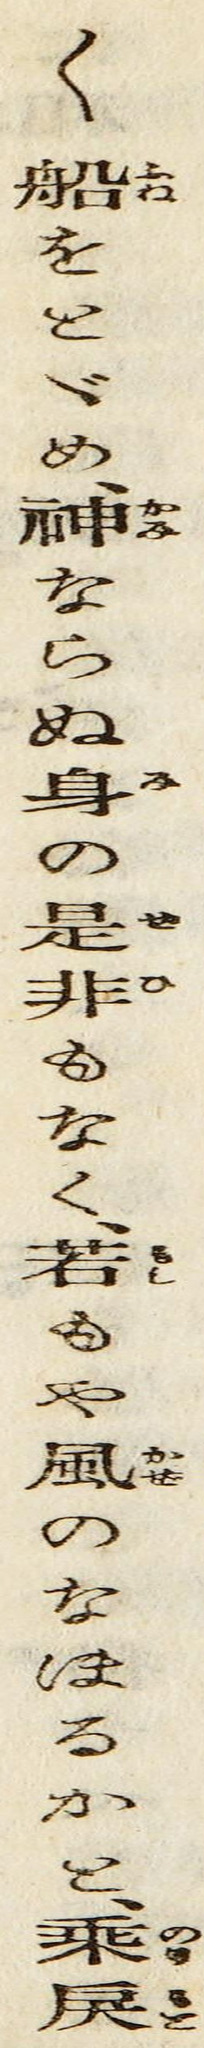〳〵船をとヾめ、神ならぬ身の是非もなく、若もや風のなほるかと、乗戻
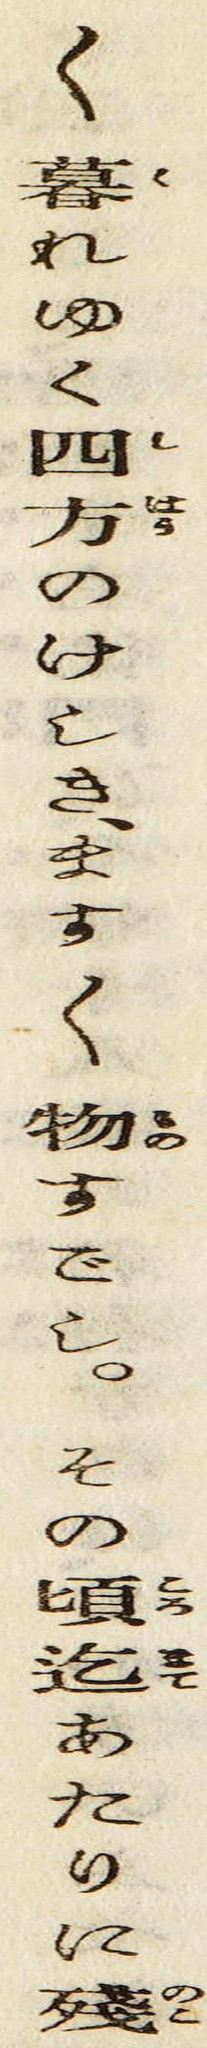〳〵暮れゆく四方のけしき、ます〳〵物すごし。その頃迄あたりに残
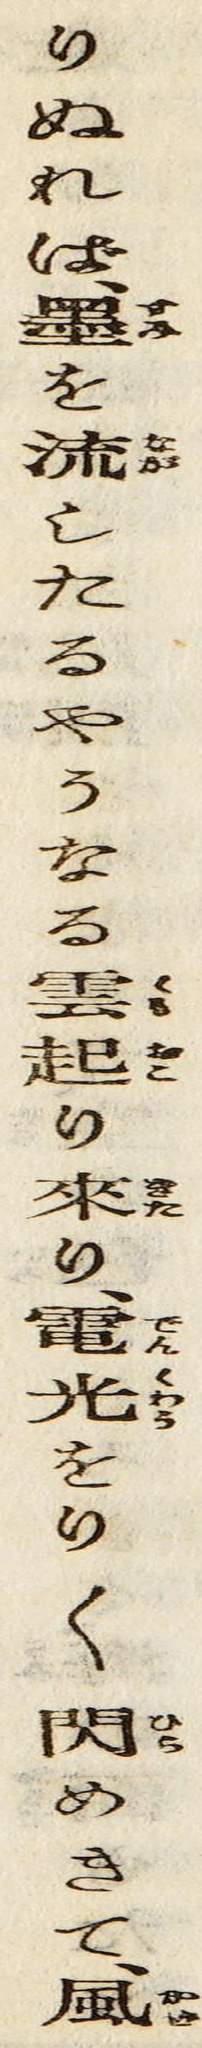りぬれば、墨流したるやうなる雲起り来り、電光をり〳〵閃めきて、風
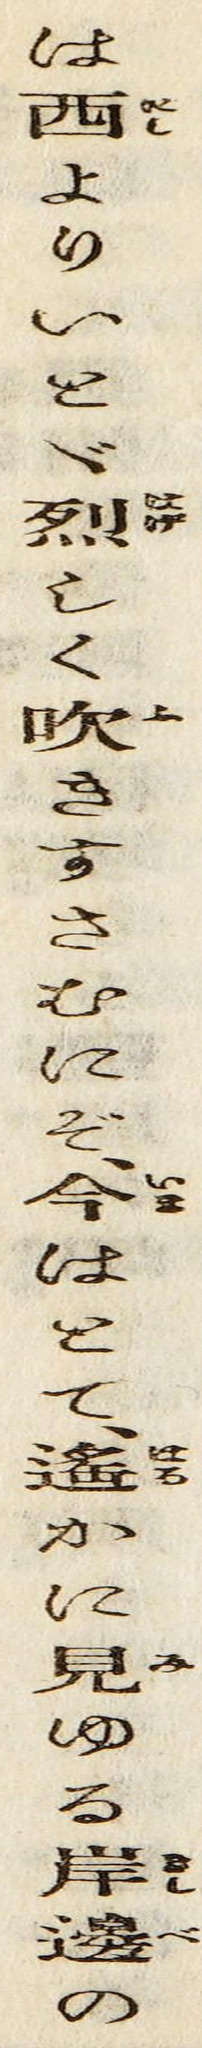は西よりいとヾ烈しく吹きすさむにぞ、今はとて、遥かに見ゆる岸辺の
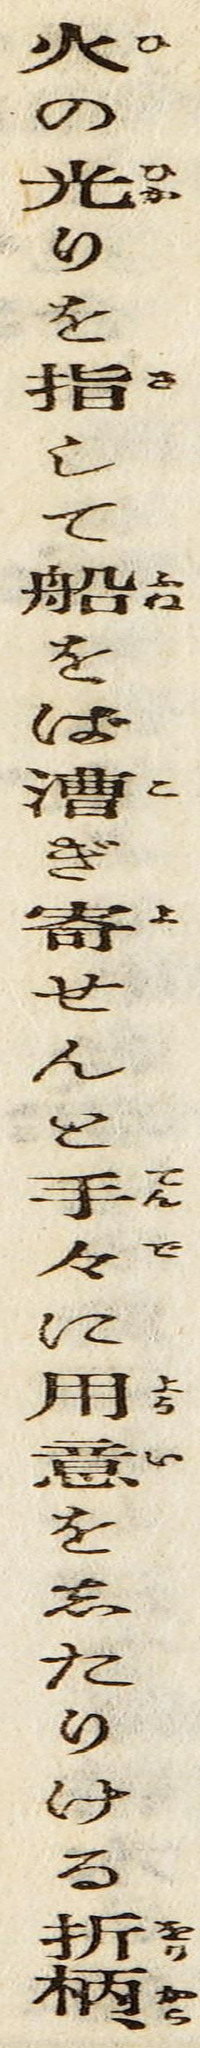火の光りを指して船をば漕ぎ寄せんと手々に用意をしたりける折柄、
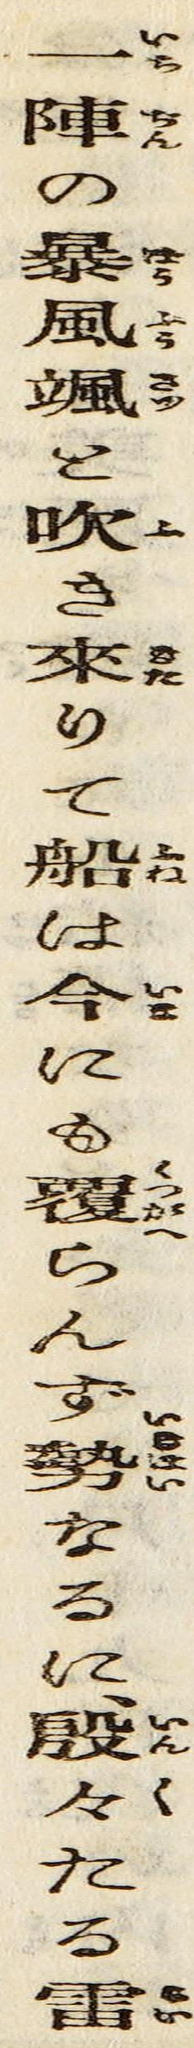一陣の暴風颯と吹き来りて船は今にも覆らんず勢なるに、殷々たる雷
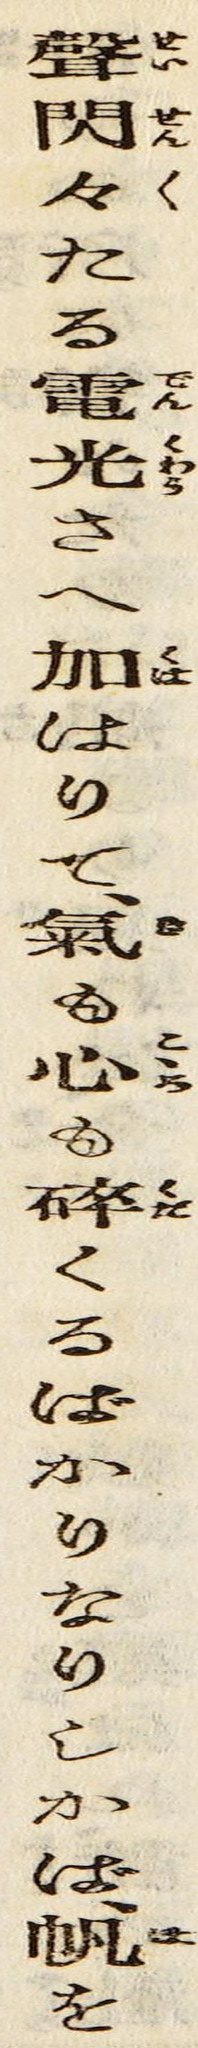声閃々たる電光さへ加はりて、気も心も砕くるばかりなりしかば、帆を
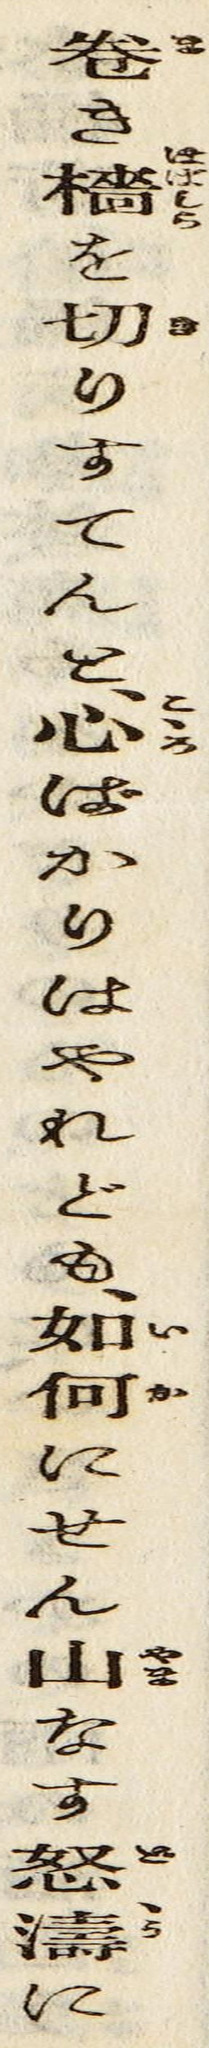巻き檣を切りすてんと、心ばかりはやれども、如何にせん山なす怒濤に
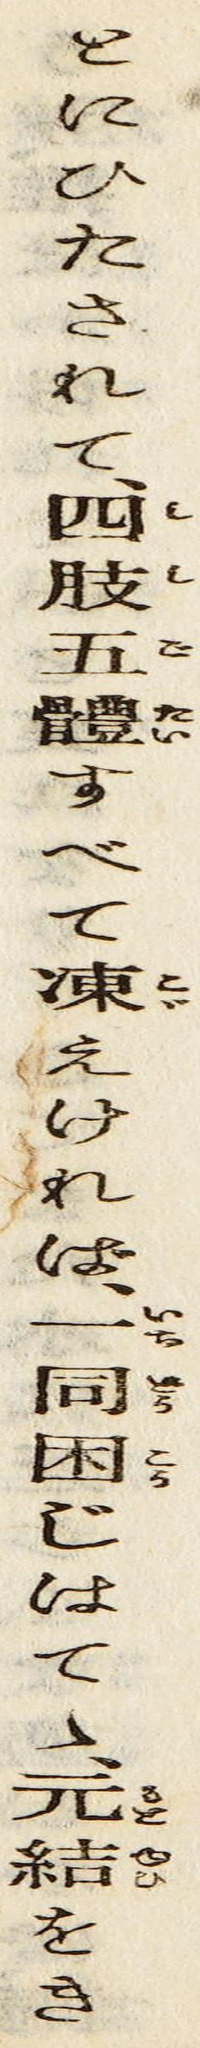とにひたされて、四肢五体すべて凍えければ、一同困じはてゝ、元結をき
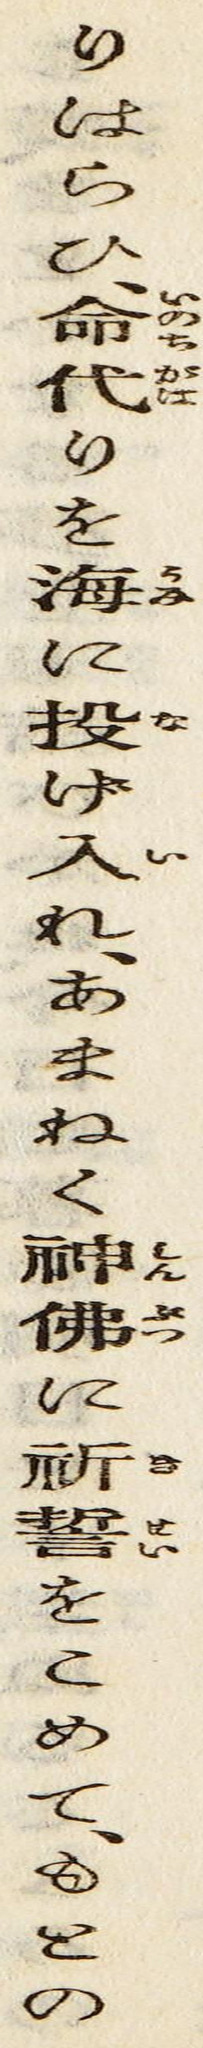りはらひ、命代りを海に投げ入れ、あまねく神仏に祈誓をこめて、もとの
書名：日本漂流譚
